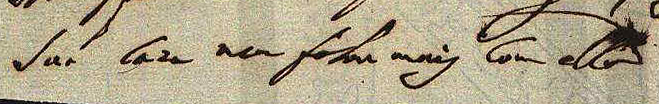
sua Caza nem falou mais Com ella
